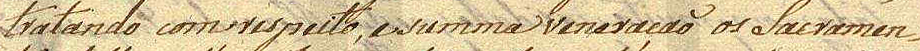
tratando com respeito, e summa veneração os Sacramen
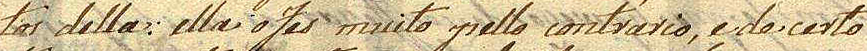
tos della, ella o fes muito pello contrario, e de certo
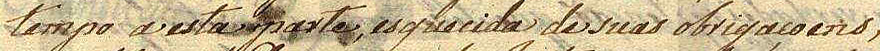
tempo a esta parte, esquecida de suas obrigaçoens,
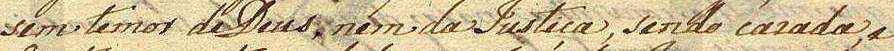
sem temor de Deus, nem da Iustiça, sendo cazada e
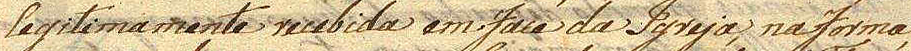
legitimamente recebida em face da Igreja, na forma
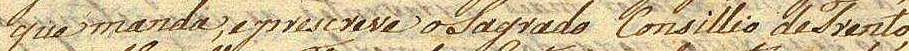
que manda, e prescreve o Sagrado Consillio de Trento,
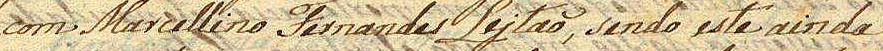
com Marcellino Fernandes Lejtaõ, sendo este ainda
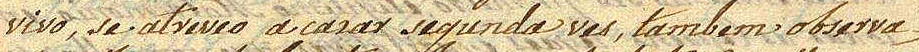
vivo, se atreveo a cazar segunda ves, tambem observa
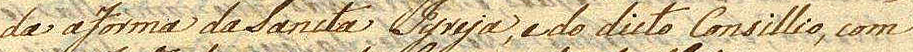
da a forma da Sancta Igreja, e do dicto Consillio, com
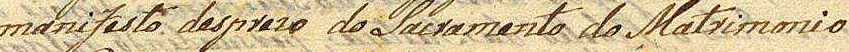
manifesto desprezo do Sacramento do Matrimonio
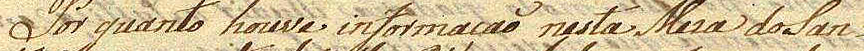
Por quanto houve informaçaõ nesta Meza do San
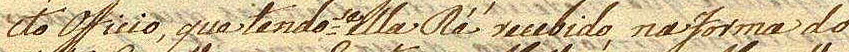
cto Officio, que tendo=se ella Ré recebido, na forma do
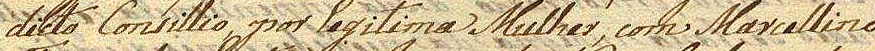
dicto Consillio, por legitima Mulher com Marcellino
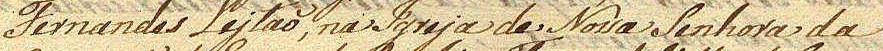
Fernandes Lejtaõ, na Igreja de Nossa Senhora da
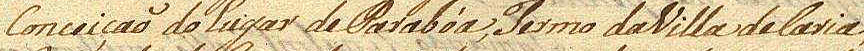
Conceiçaõ do Lugar de Parabóa, Termo da Villa de Caria,
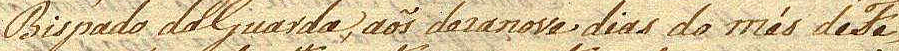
Bispado da Guarda, aos dezanove dias do més de Fe
